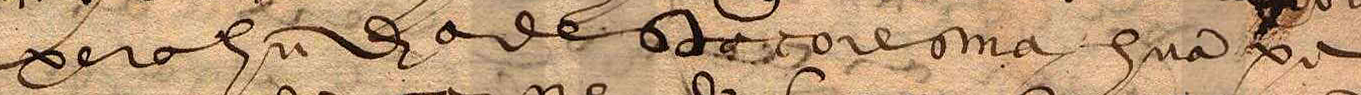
xera hū dja desta coresma huā pe
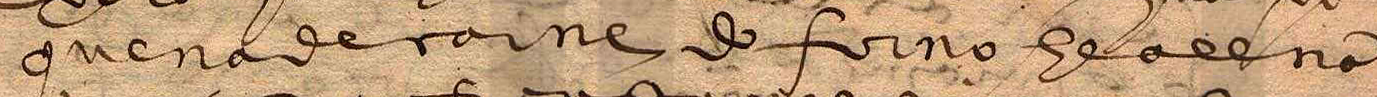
quena de carne do forno he all nā
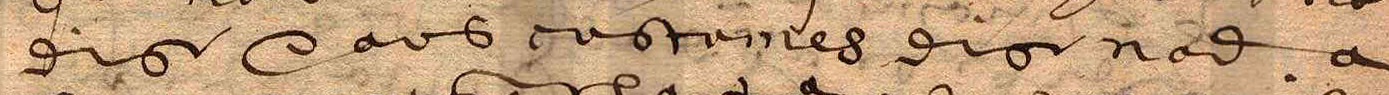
dise e aos custumes dise nada
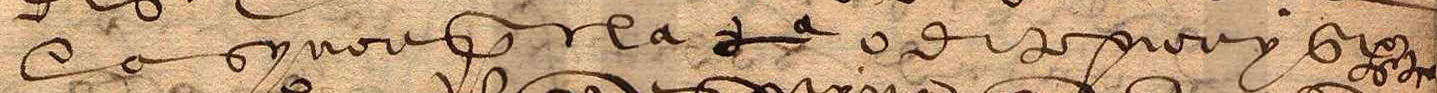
e asynou p̄ ela ta o dito prouysor ꝑsēte
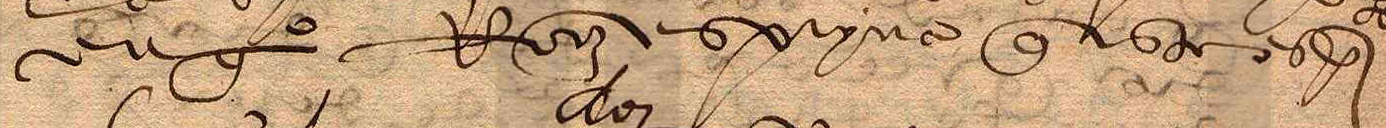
eu go Rōiz espryuā q̄ esto esp̄j
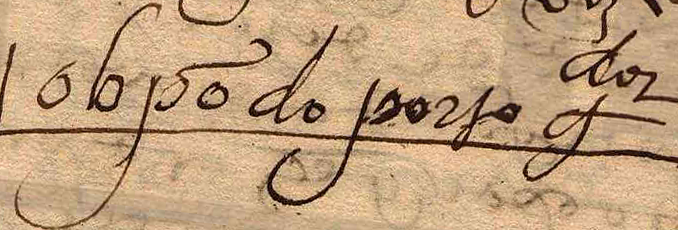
o bpō do porto gdor
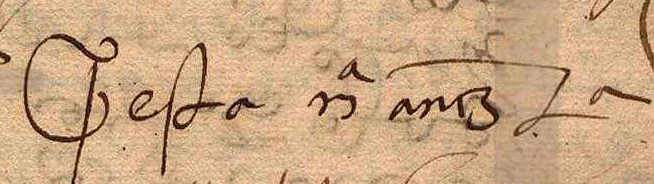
p̄o esta ma ānez ta
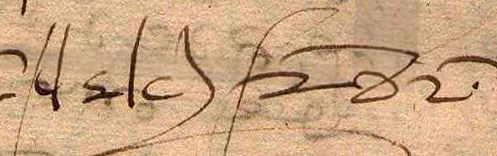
Melch fr̄z
